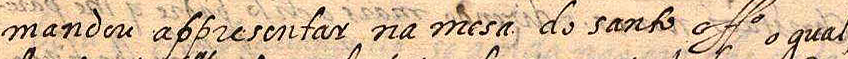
mandou appresentar na mesa do santo offo o qual,
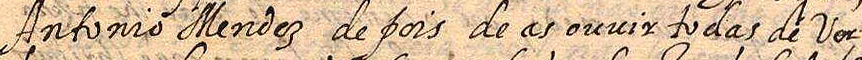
Antonio Mendez depois de as ouuir todas de Ver
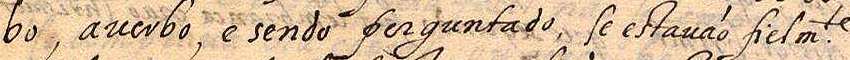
bo, a uerbo, e sendo perguntado, se estauaõ fielm.te
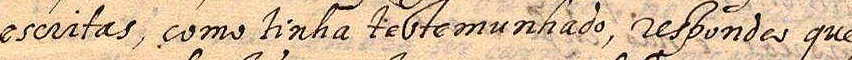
escritas, como tinha testemunhado, respondeo que
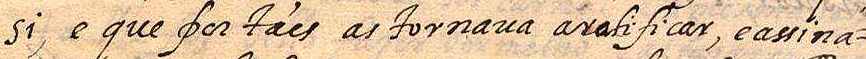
si, e que por taēs as tornaua a ratificar, e assina
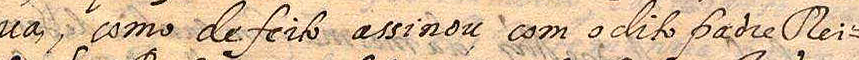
ua, como de feito assinou, com o dito padre Rei
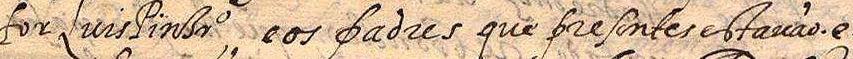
tor Luis Pinhro, e os padres que presentes estauão. e
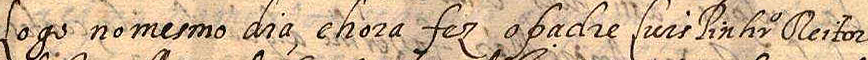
Logo no mesmo dia, e hora fez o padre Luis Pinhro Reitor
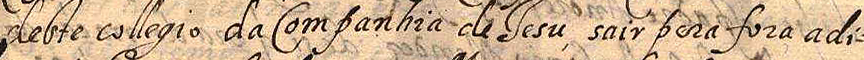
deste collegio da Companhia de Iesu, sair pera fora a di
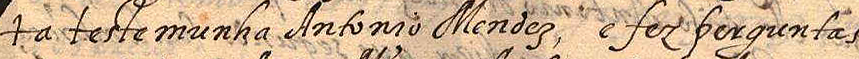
ta testemunha Antonio Mendez, e fez perguntas
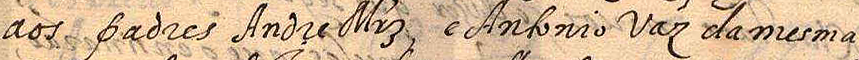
aos padres Andre Mr̄z, e Antonio Vaz da mesma
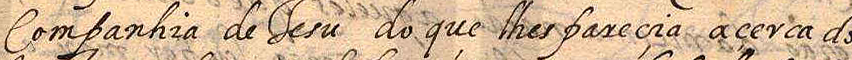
Companhia de Iesu do que lhes pareçia açerca do
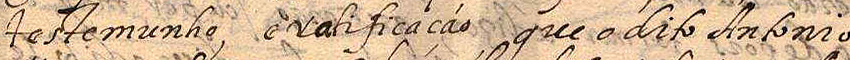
testemunho, e ratificação, que o dito Antonio
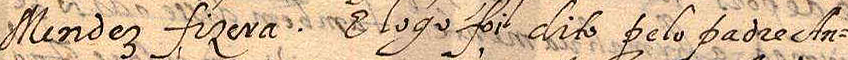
Mendez fizera. E logo foi dito pelo padre An
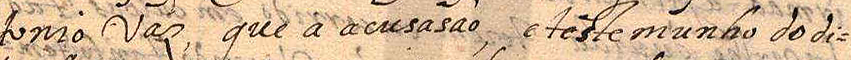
tonio Vaz, que a acusasaõ, e testemunho do di
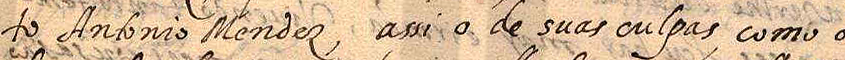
to Antonio Mendez, assi o de suas culpas, como o
